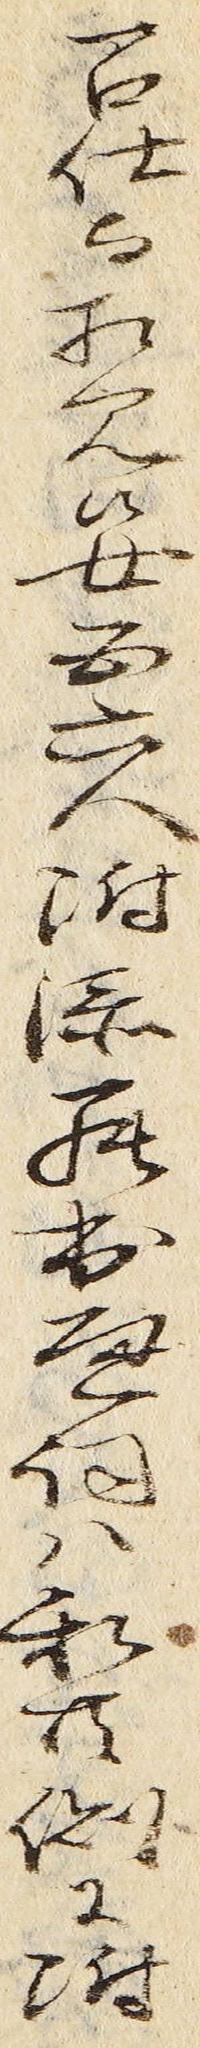召仕と相見候女五六人附添罷出通詞は私共側に附
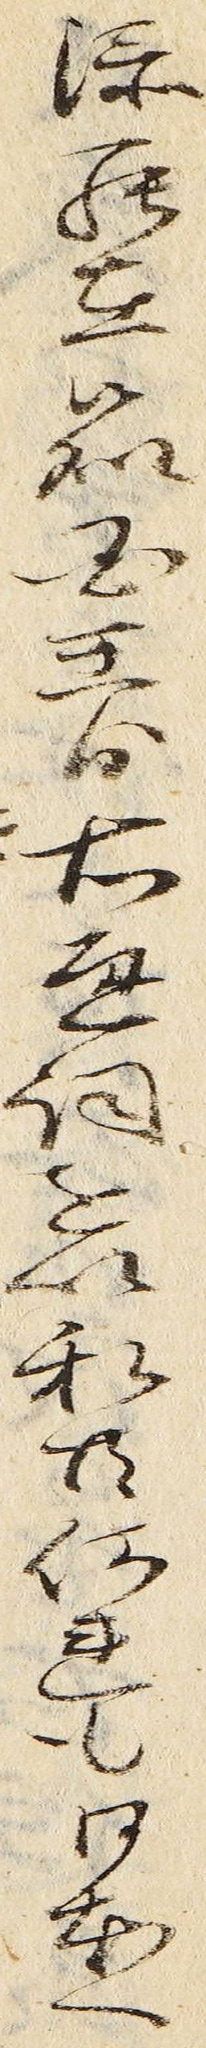添罷在候処国王ゟ右通詞を以私共何れも日本へ
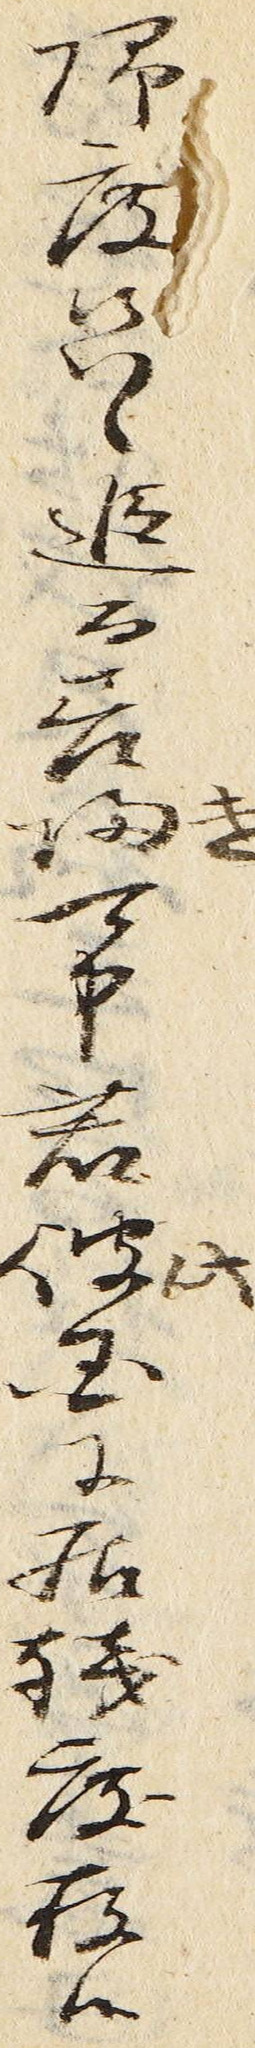帰度候ハヽ追て差帰可申若彼国に居残度存候
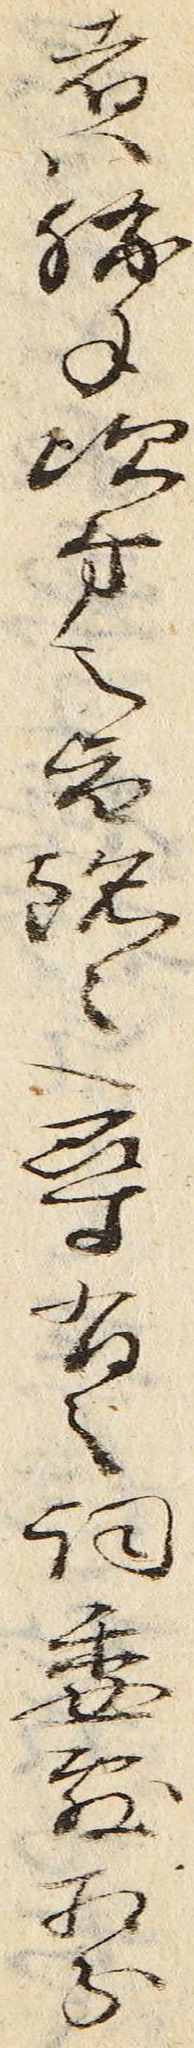者は勝手次第之旨銘々へ尋有之詞委敷相分
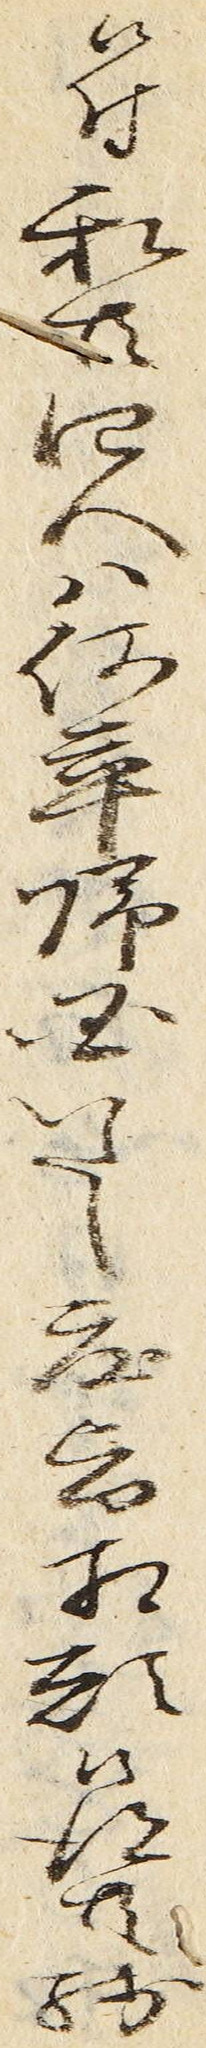候付私共四人は何卒帰国いたし度旨相願候得共残
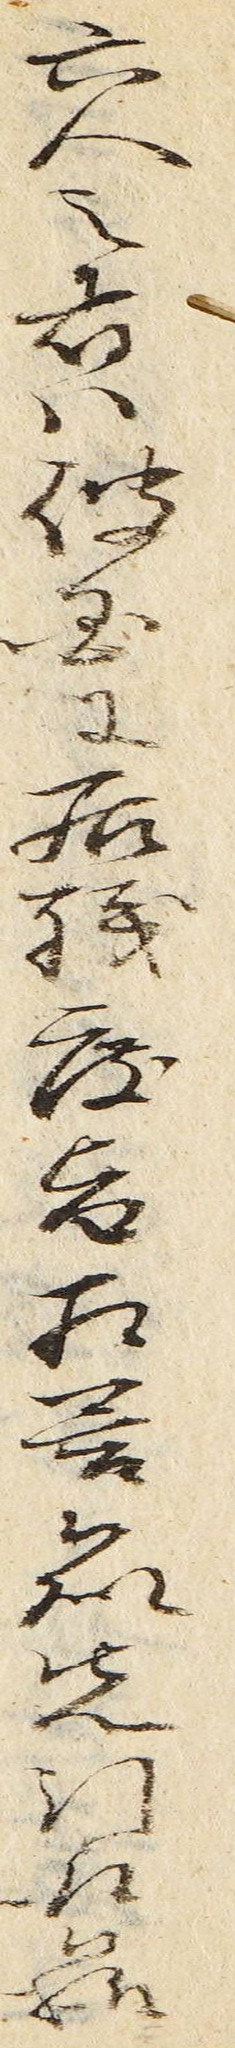六人之者は彼国に居残度旨相答候処先引取候様
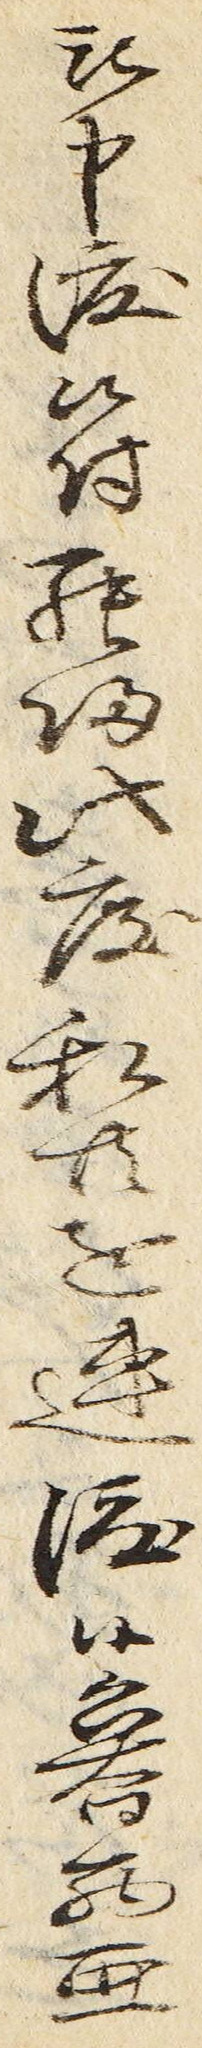被申渡候付罷帰此度私共を連渡候魯西亜
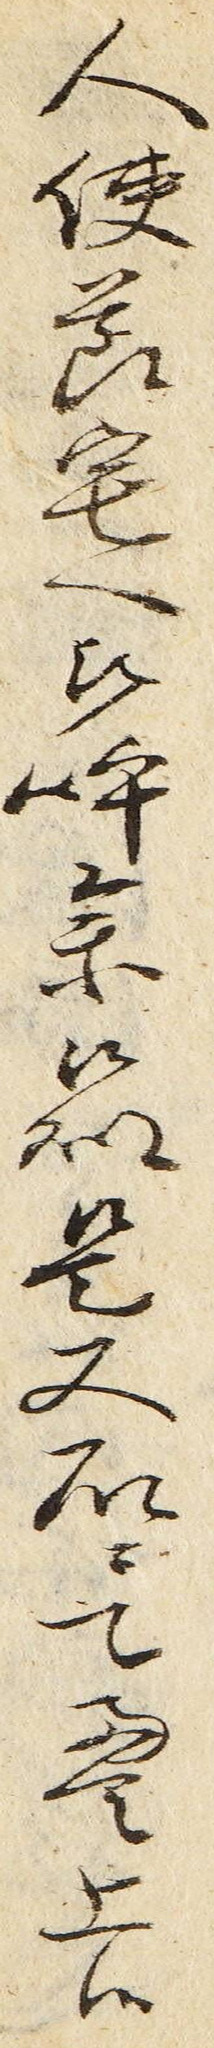人使節宅へ被呼参候処是又石にて畳上候
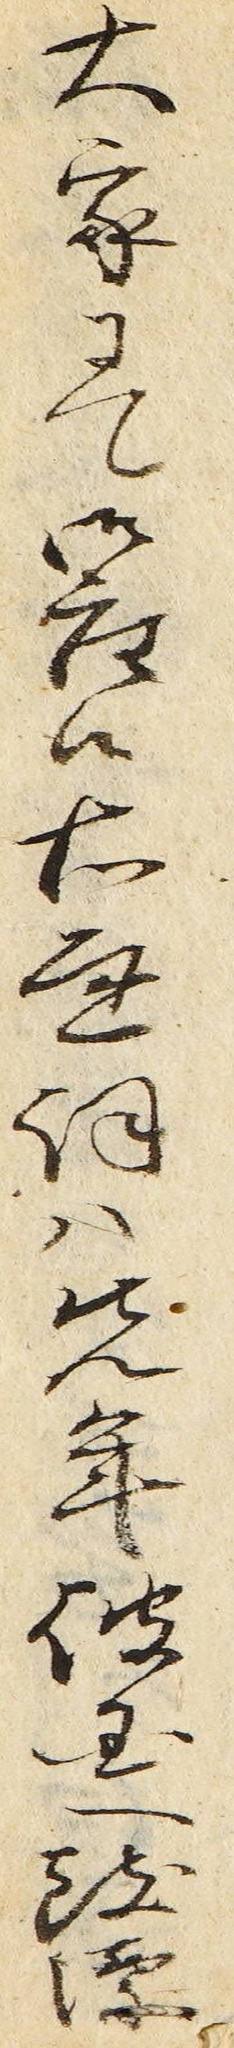大家にて御座候右通詞は先年彼国へ致漂

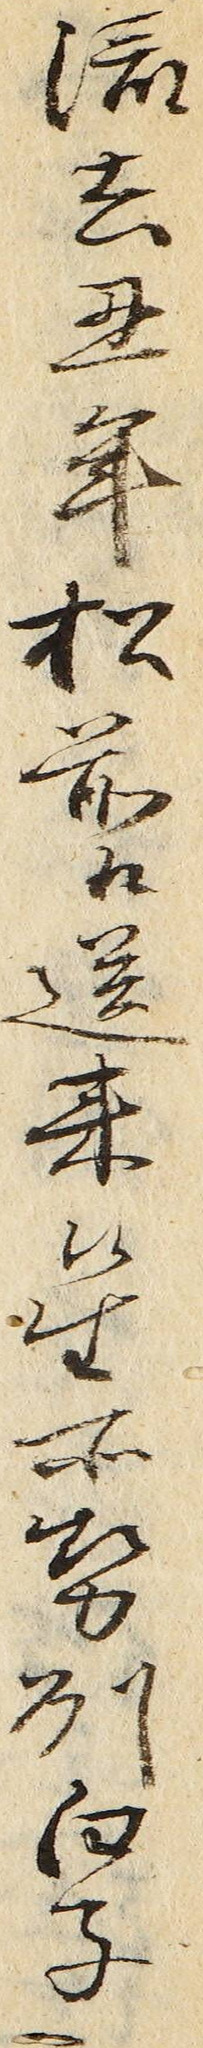流去丑年松前え送来候生所勢州白子
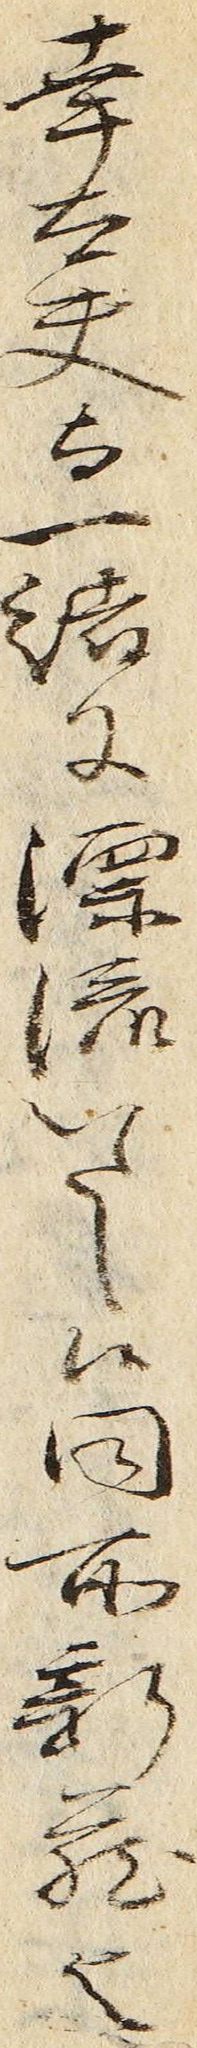幸太夫と一緒に漂流いたし候同所新蔵と
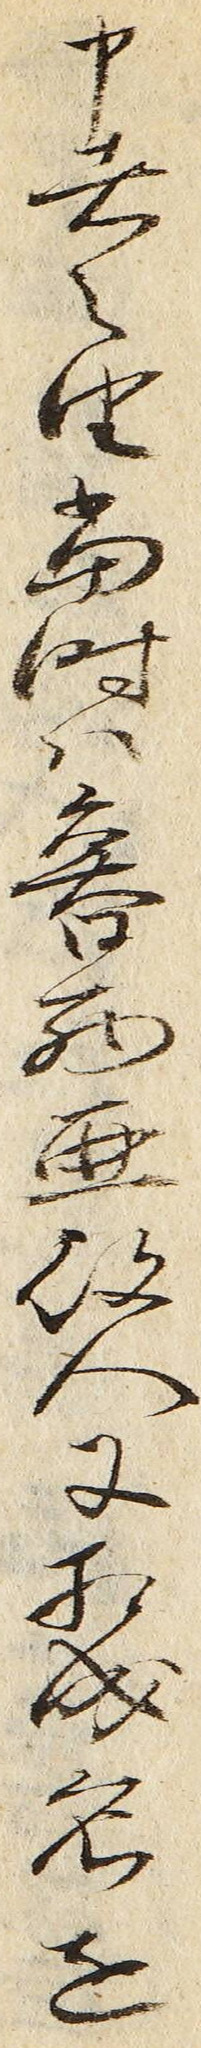申者之由当時は魯西亜役人に相成名を
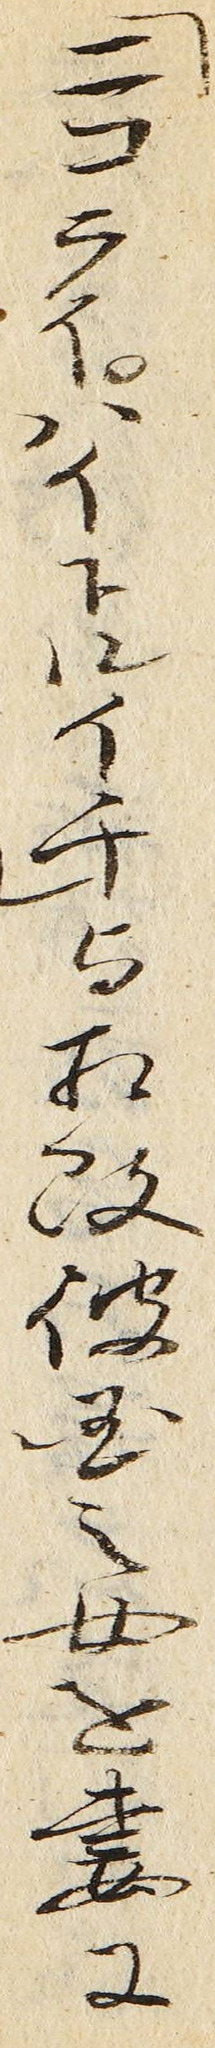「ニコライ。ハイトルイチ」と相改彼国之女を妻に
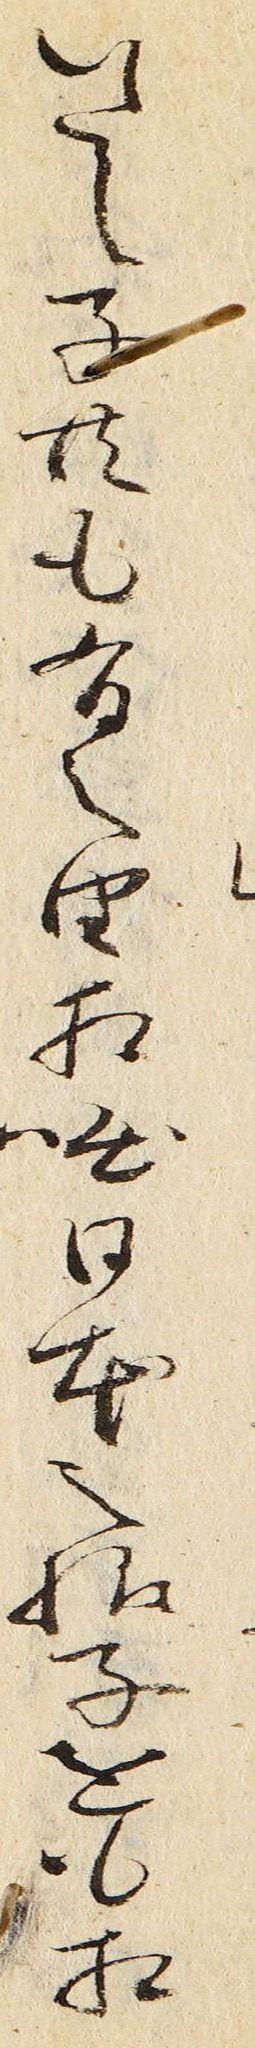いたし子共も有之由相咄日本之様子をも相
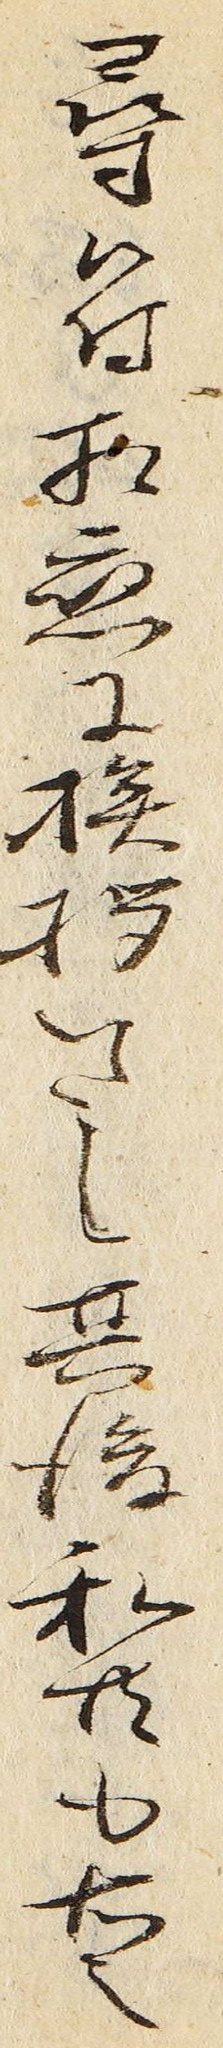尋候付相応に挨拶いたし其後私共も右之
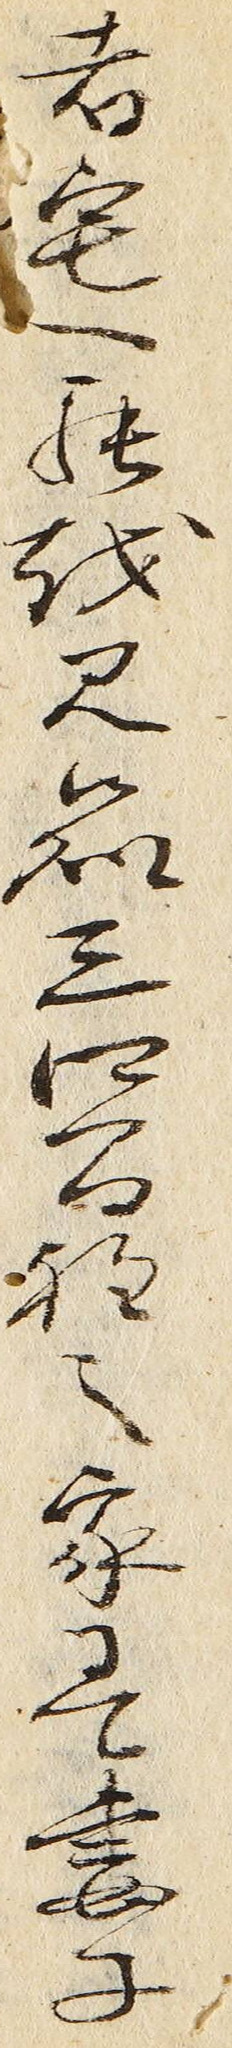者宅へ罷越見候処三四間程之家にて妻子
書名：漂民後記
